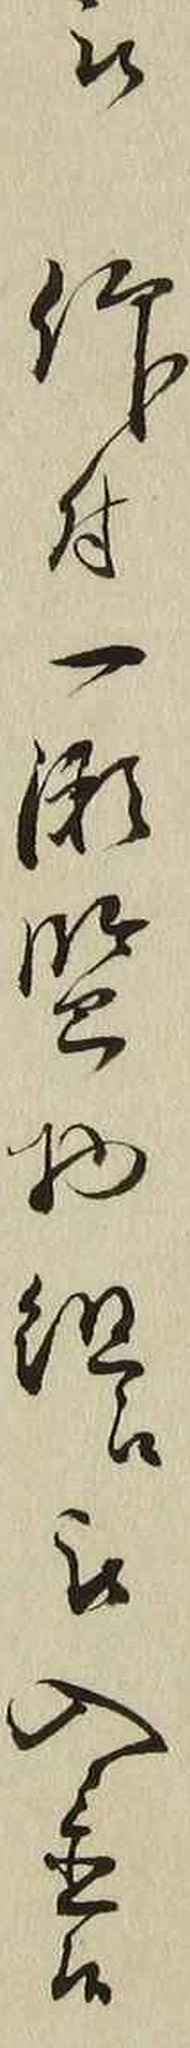被仰付一瀬監物組江被入置候
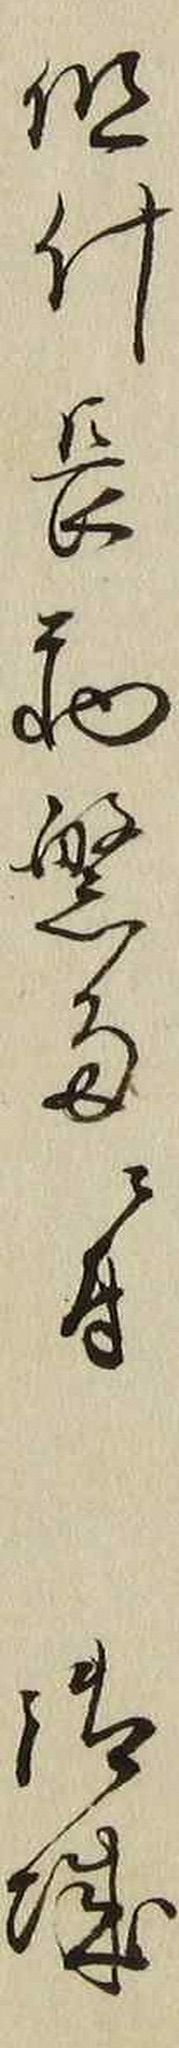但什長勤繁多に付御城
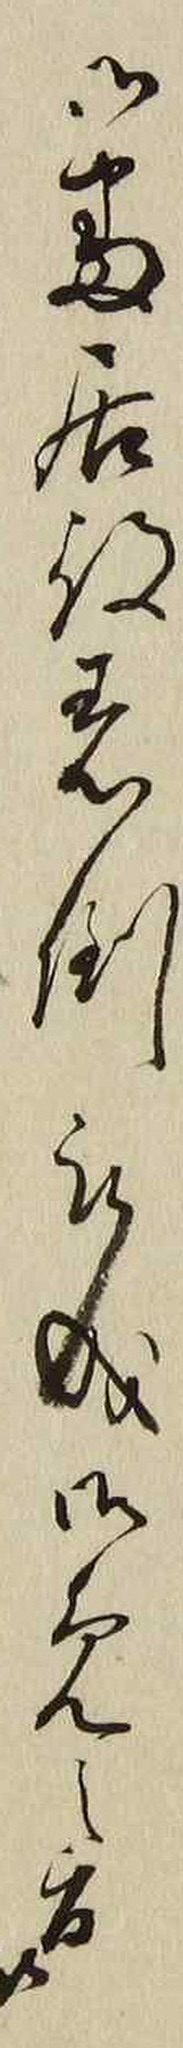御番居役着倒被成御免の旨被
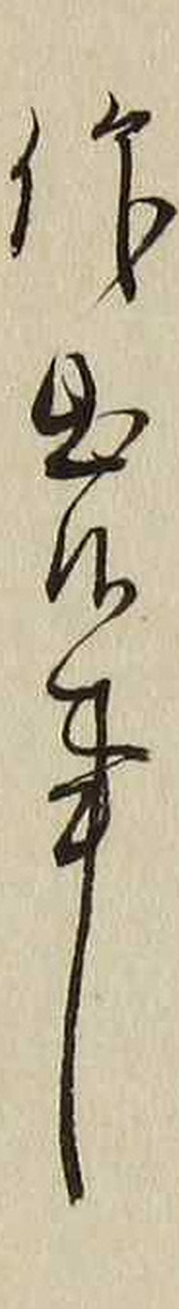仰出候事
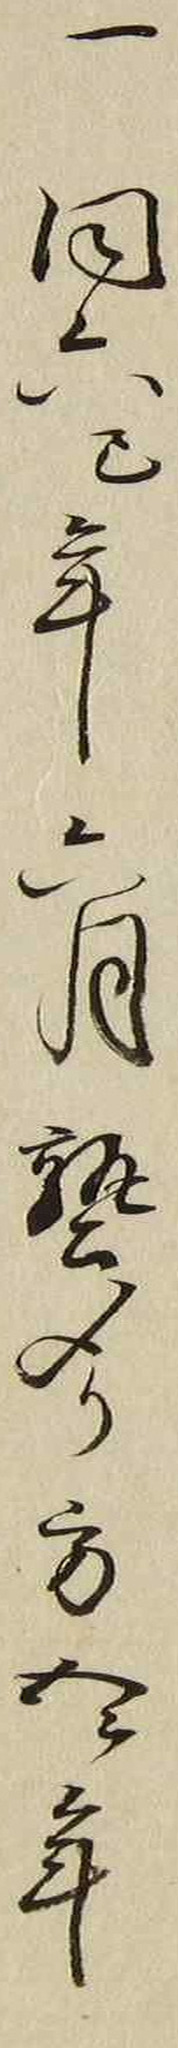一同六巳年六月塾〆り方五ケ年
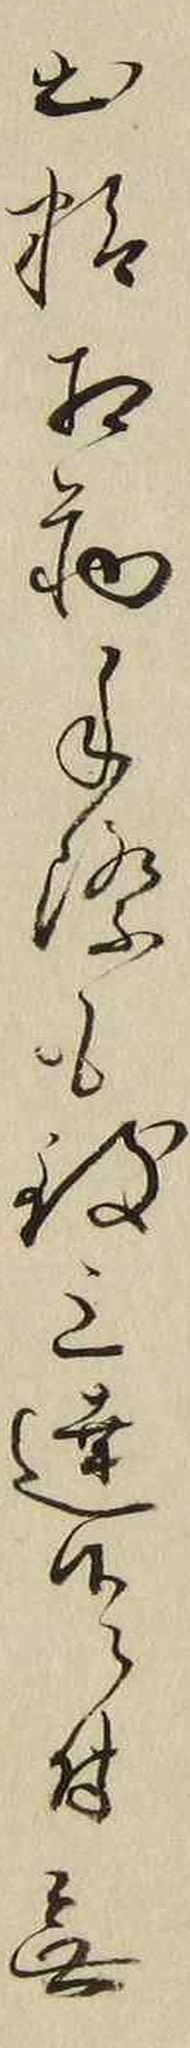出精相勤手際も致上達候に付無
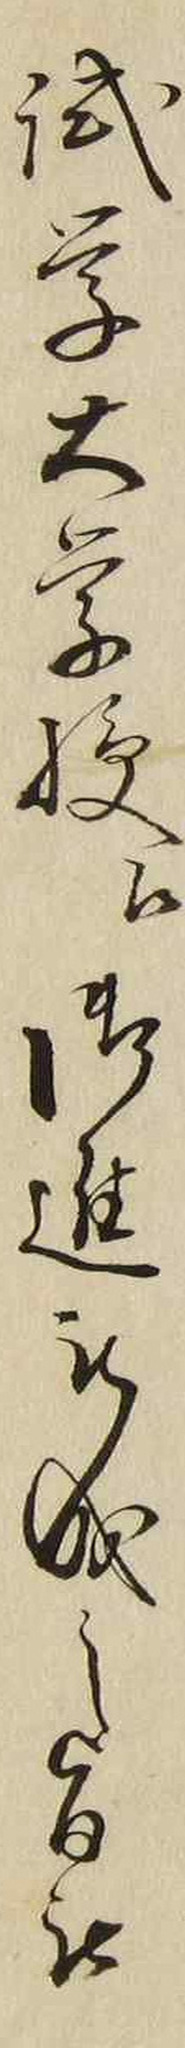試学大学授江御進被成の旨被

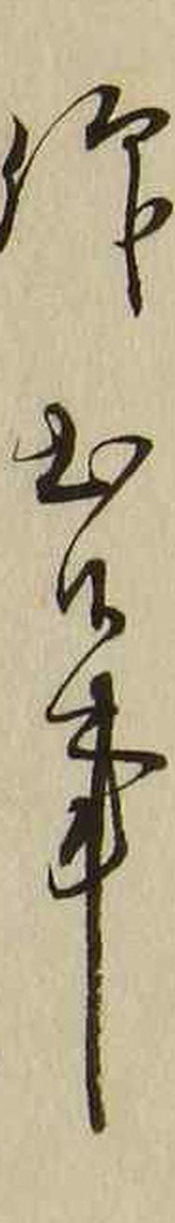仰出候事
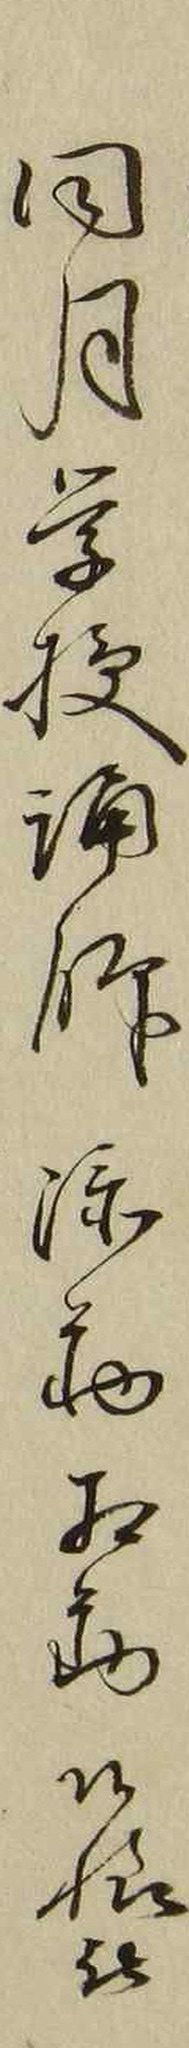一同月学授誦師添勤相勤候様被
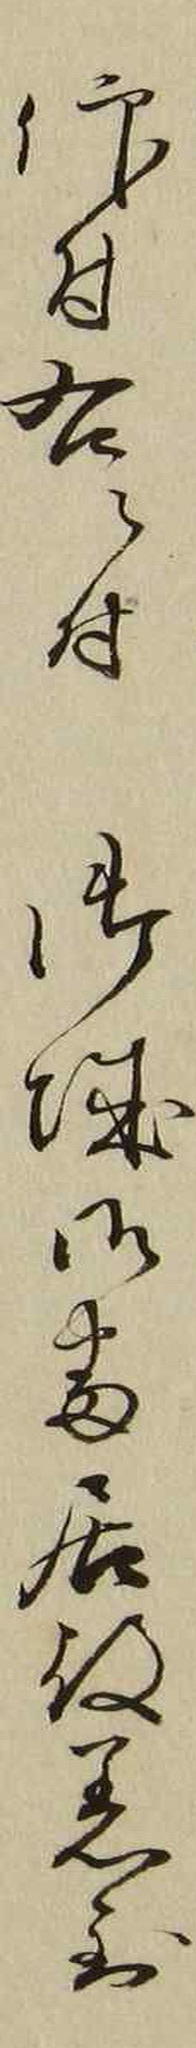仰付右に付御城御番居役着到
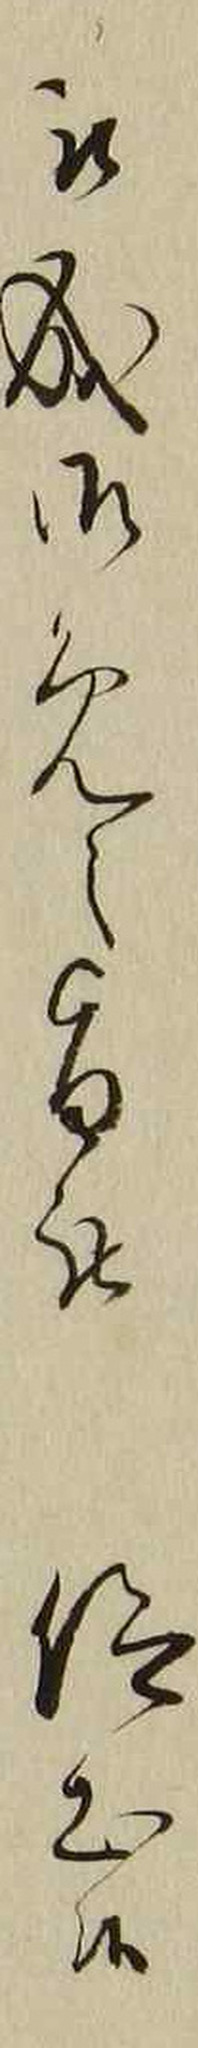被成御免の旨被仰出候
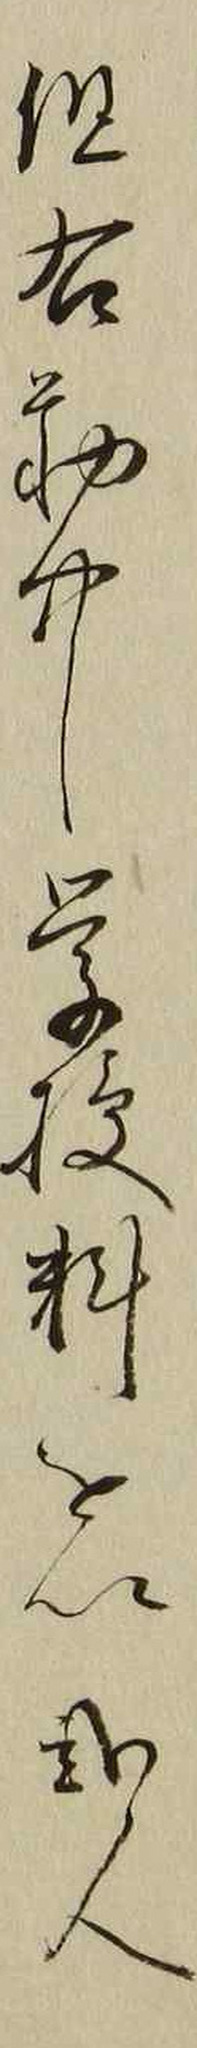但右勤中学授料を以弐人
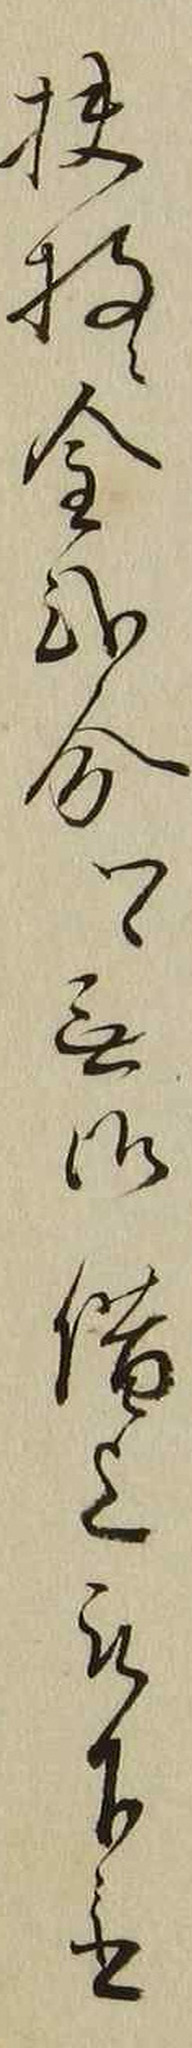扶持に金弐分つヽ無御借上被下置
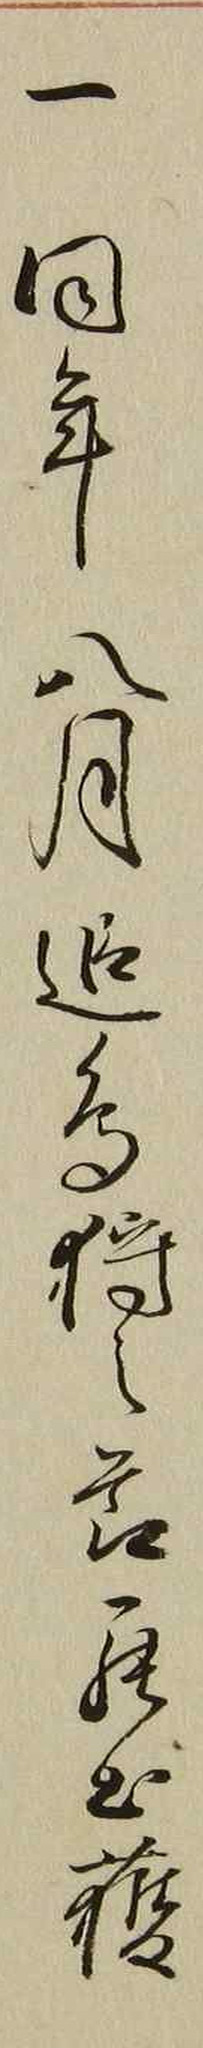一同年八月追鳥狩の節罷出獲
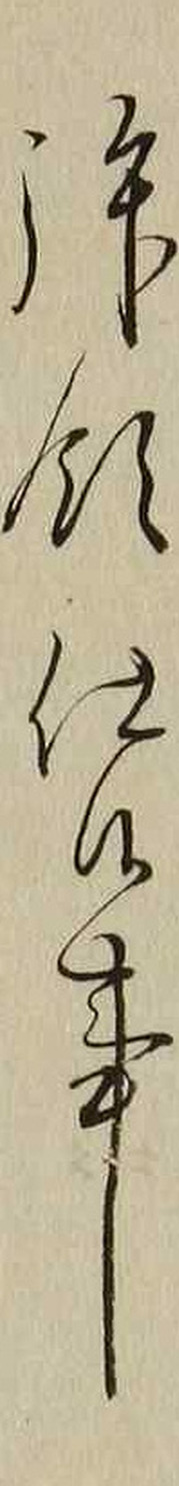拝領仕候事
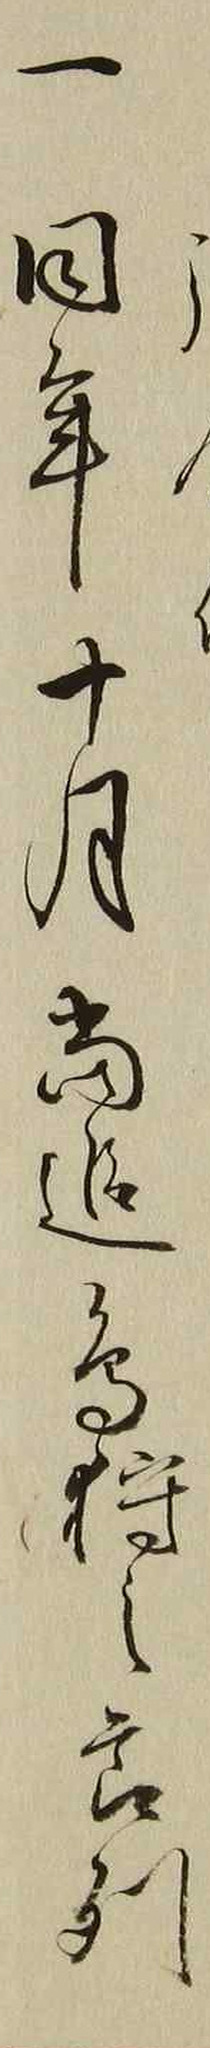一同年十月当追鳥狩の節列
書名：諸士系譜　巻之1　い之部1
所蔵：会津若松市立会津図書館
